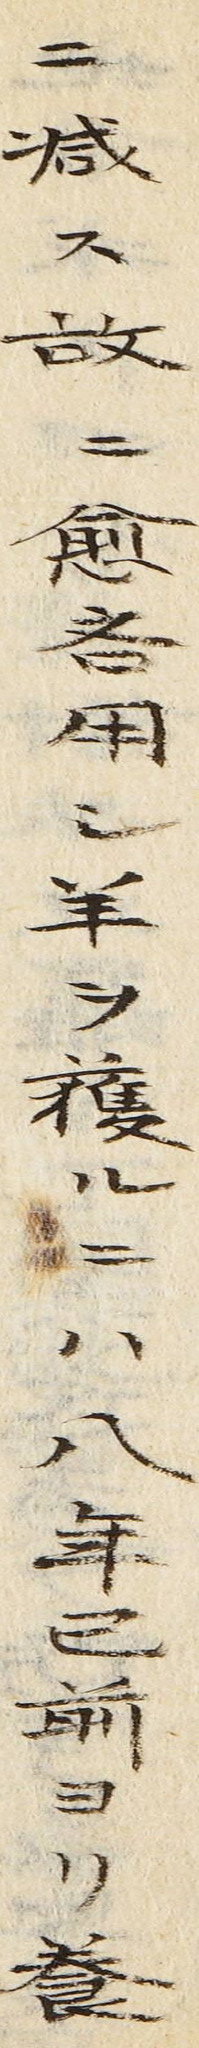ニ減ス故ニ愈吝用シ羊ヲ獲ルニハ八年已前ヨリ養
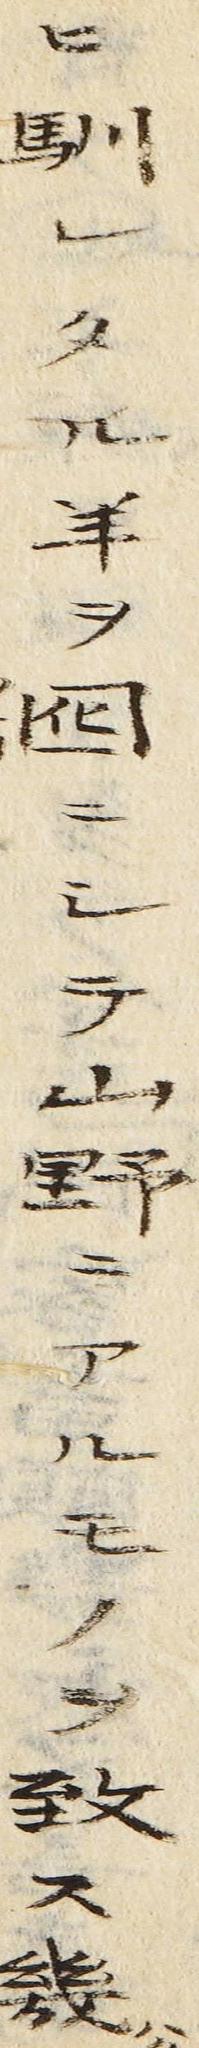ヒ馴レタル羊ヲ囮ニシテ山野ニアルモノヲ致ス幾
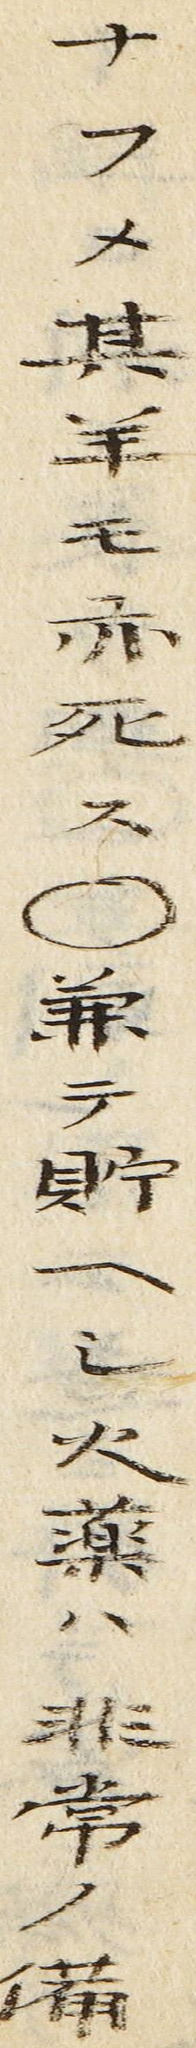ナフシテ其羊モ亦死ス◯兼テ貯ヘシ火薬ハ非常ノ備
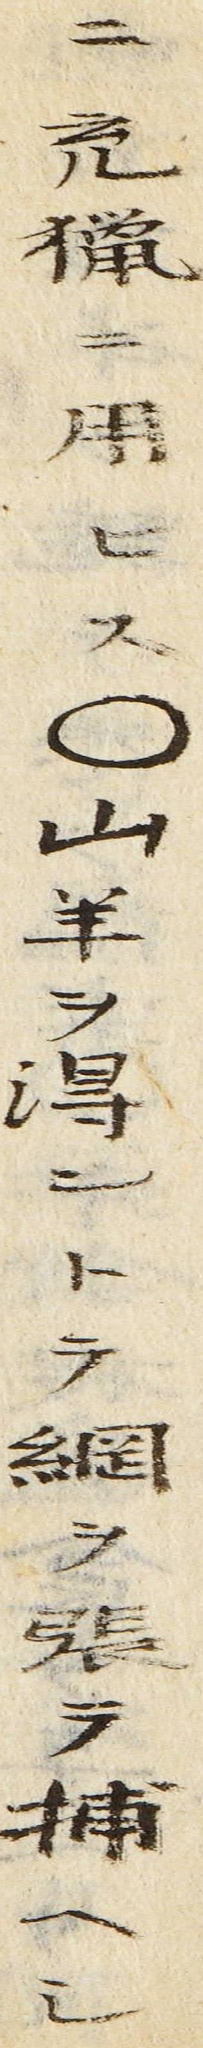ニ充猟ニ用ヒス◯山羊ヲ得ントテ綱ヲ張テ捕ヘシ
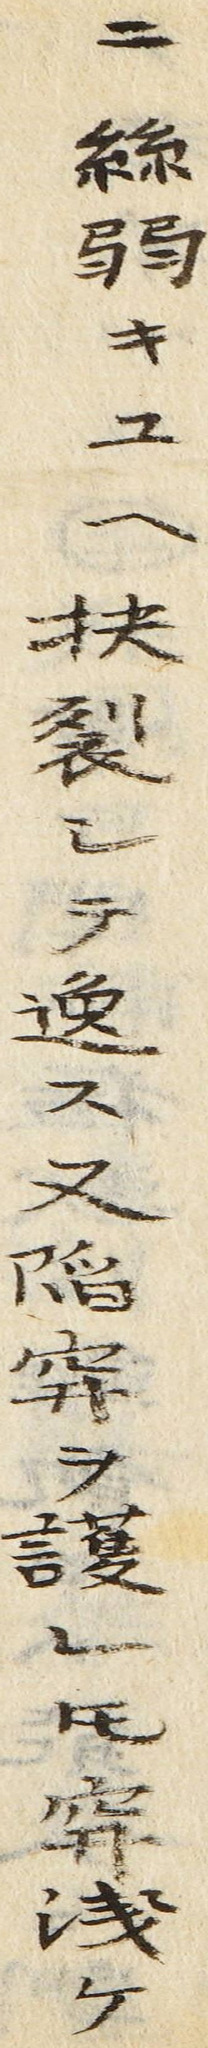ニ絲弱キユヘ抉裂シテ逸ス又陥穽ヲ護レトモ穽浅ケ
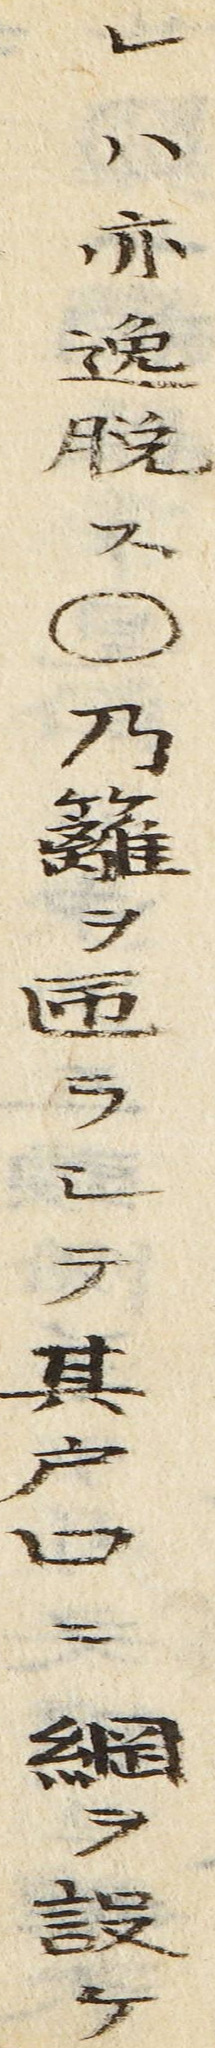レハ亦逸脱ス◯乃籬ヲ匝ラシテ其戸口ニ綱ヲ設ケ
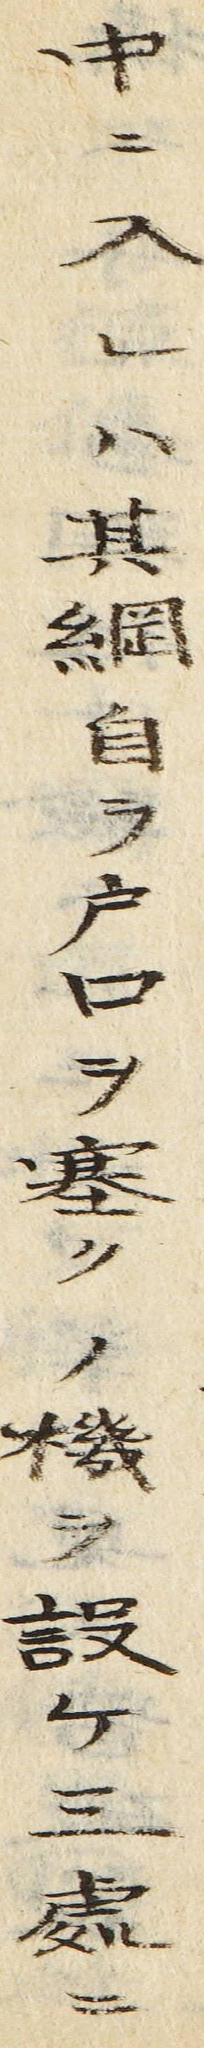中ニ入レハ其綱自ラ戸口ヲ塞クノ機ヲ設ケ三処ニ

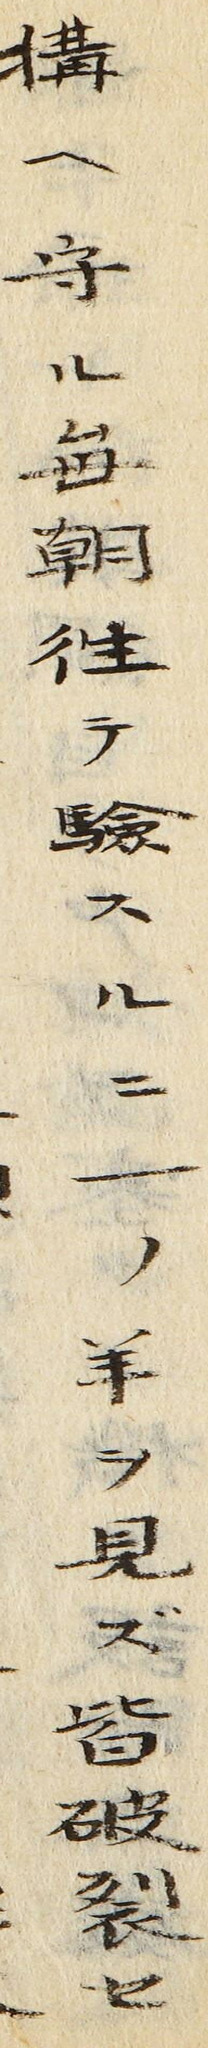搆ヘ守ル毎朝往テ験スルニ一ノ羊ヲ見ズ皆破裂セ
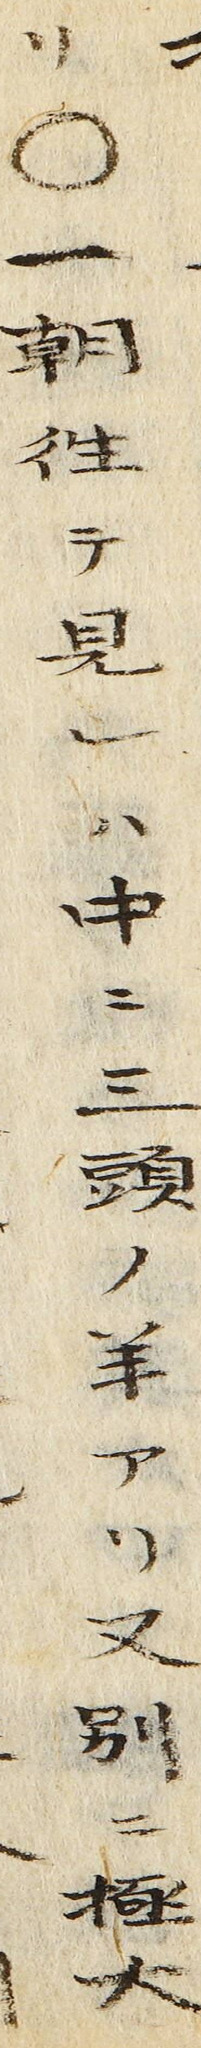リ◯一朝往テ見レハ中ニ三頭ノ羊アリ又別ニ極大
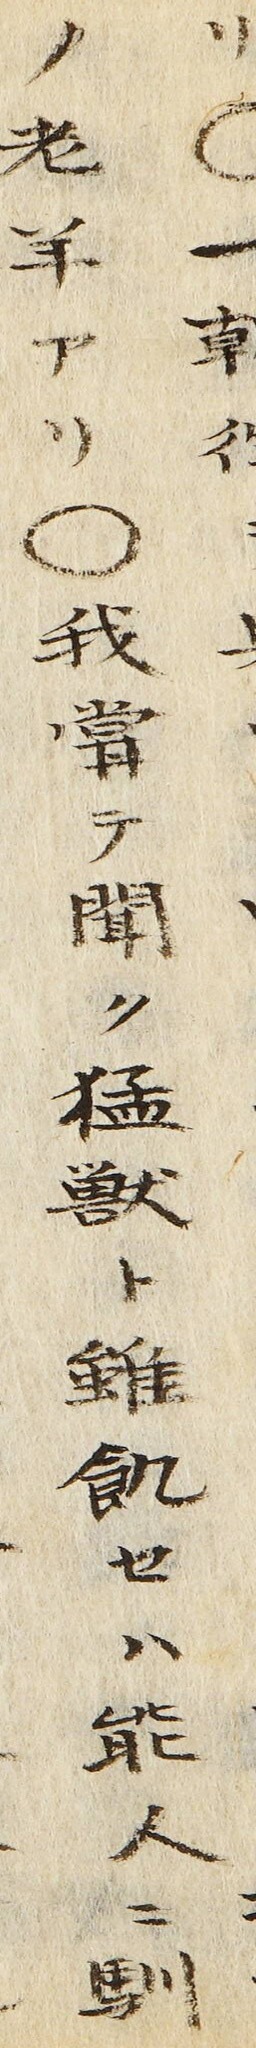ノ老羊アリ◯我嘗テ聞ク猛獣ト雖飢セハ能人ニ馴
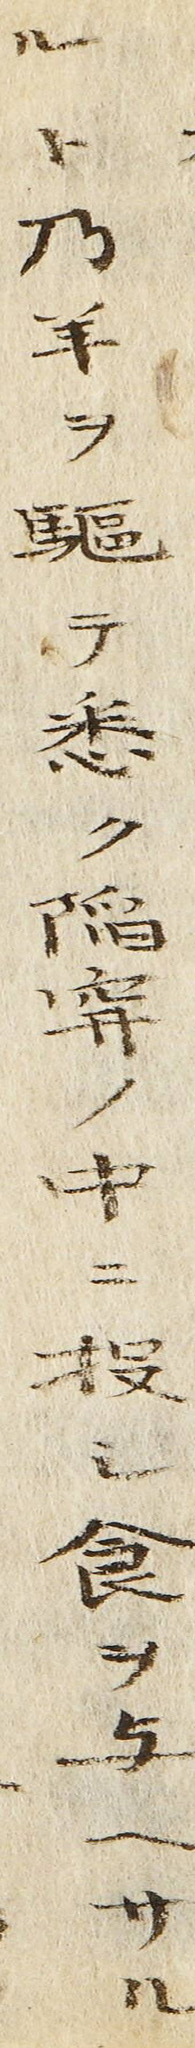ルト乃羊ヲ駆テ悉ク陥穽ノ中ニ投シ食ヲ与ヘサル
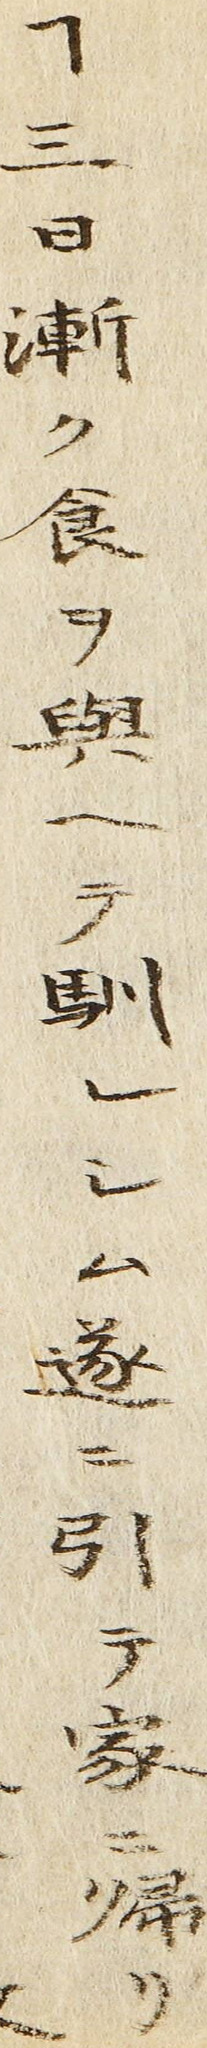コト三日漸ク食ヲ与ヘテ馴レシム遂ニ引テ家ニ帰リ
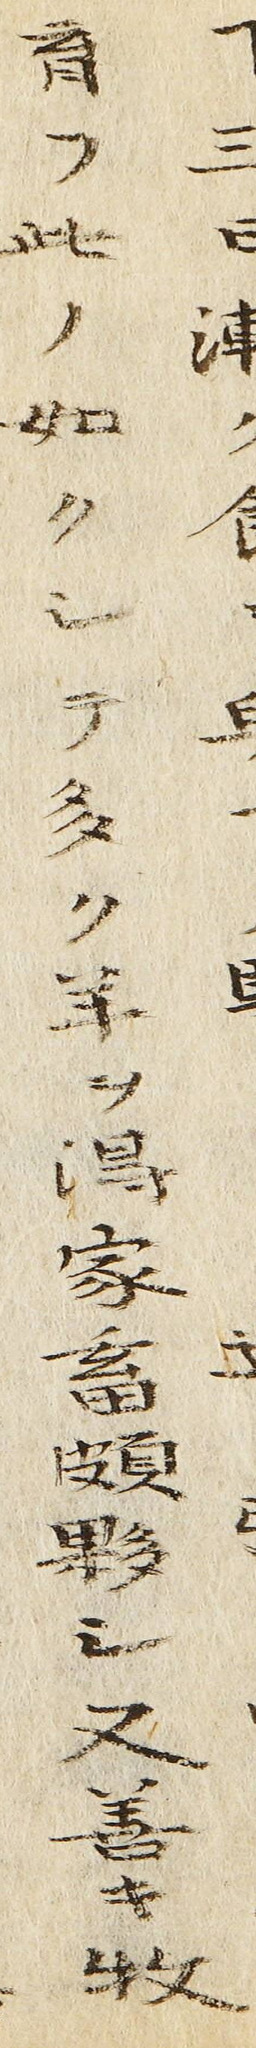育フ此ノ如クシテ多ク羊ヲ得家畜頗夥シ又善キ牧
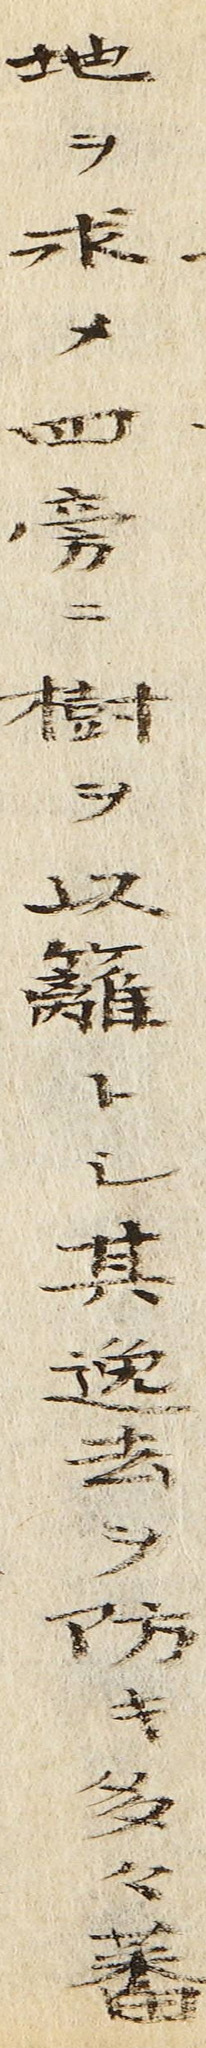地ヲ求メ四旁ニ樹ヲ以籬トシ其逸去ヲ防キ多々蕃
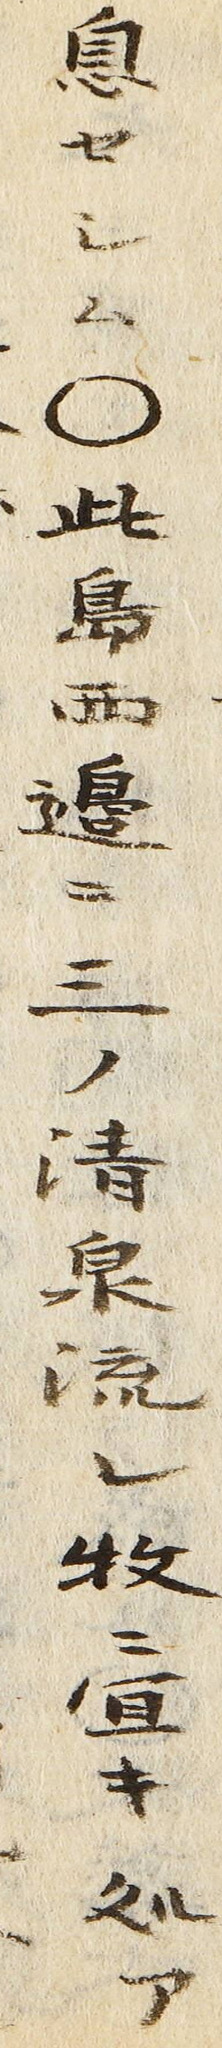息セシム◯此島西辺ニ三ノ清泉流レ牧ニ宜キ処ア
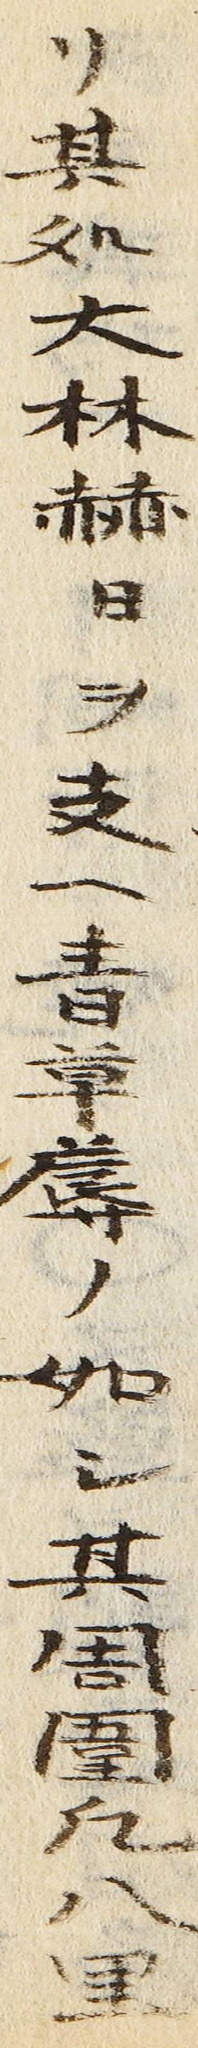リ其処大林赫日ヲ支ヘ青草蓐ノ如シ其周囲凡八里
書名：漂流紀事
